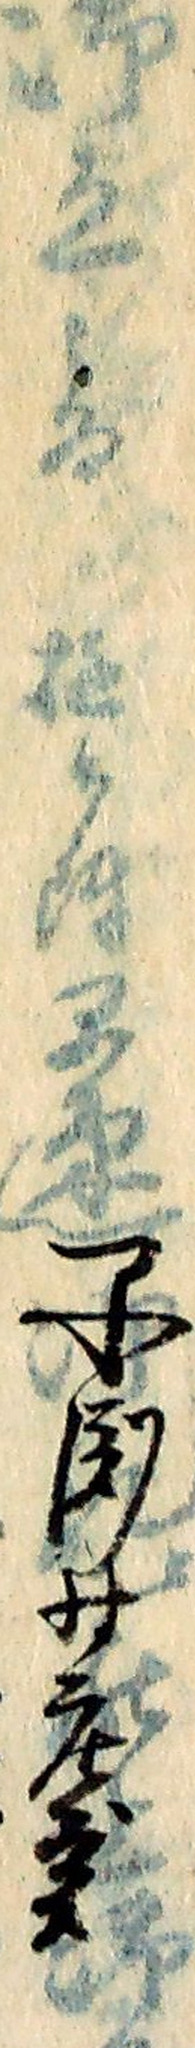早淵村庄煎
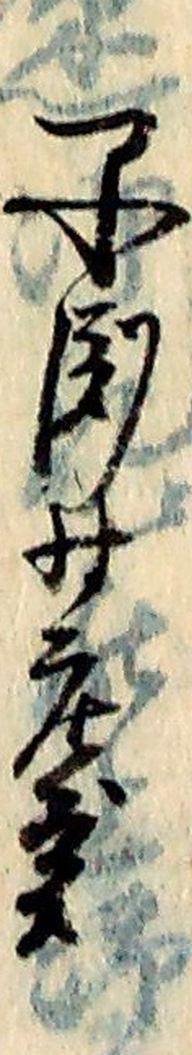早淵村庄煎
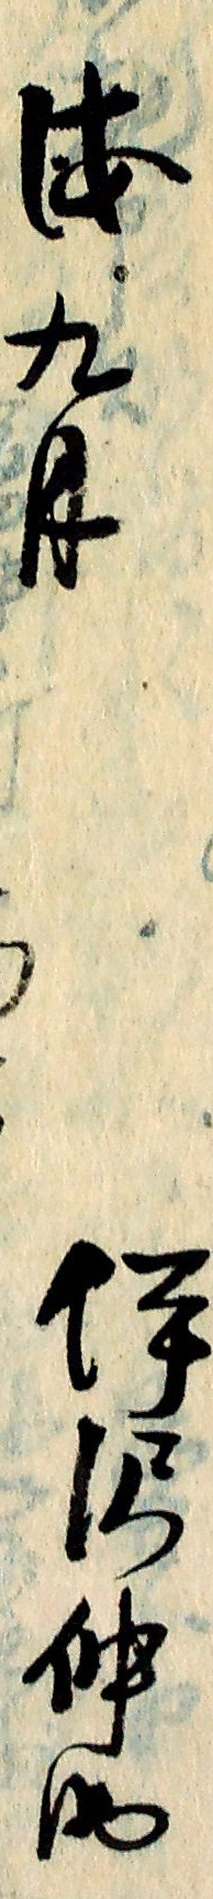戌九月伊沢仲助
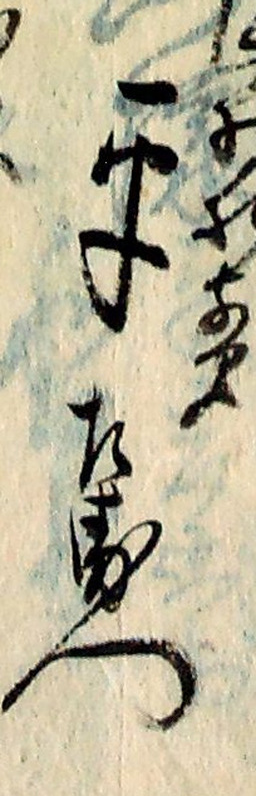平左衛門
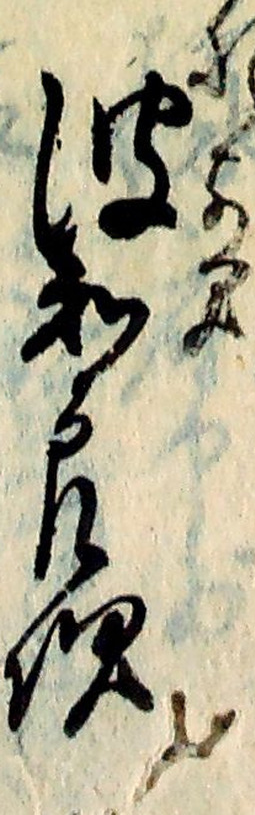波和良次
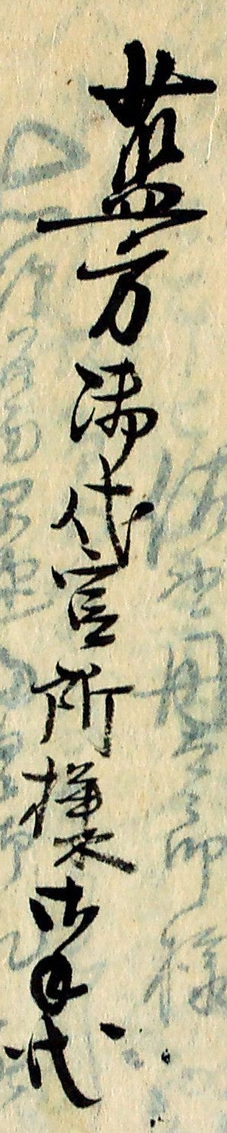藍方御代官所様御手代
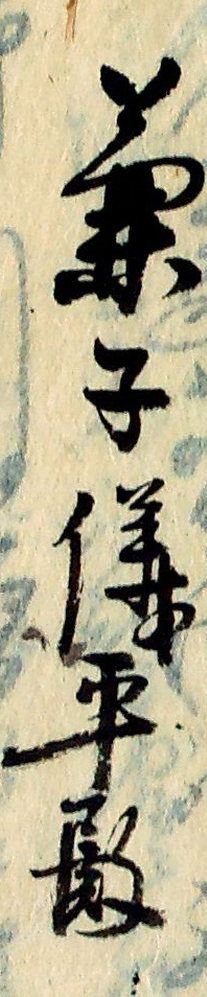兼子儀平殿

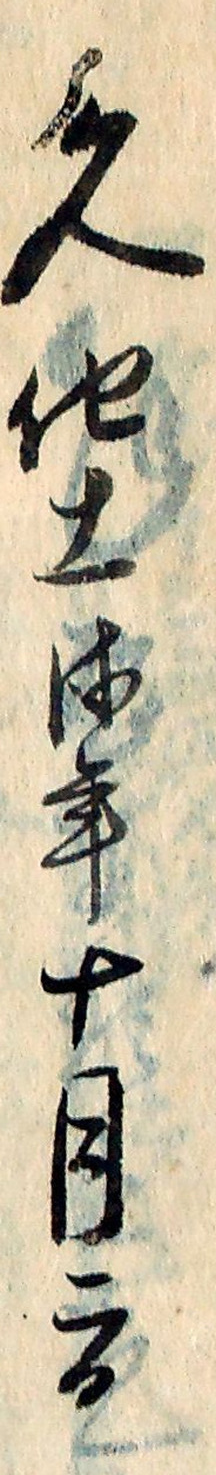文化十一戌年十月二日
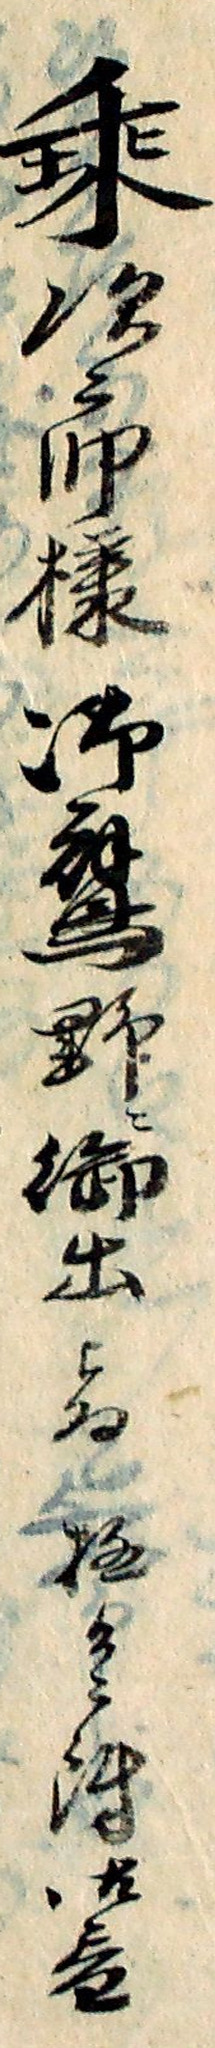乗次郎様御鷹野に御出被為遊候に附御昼
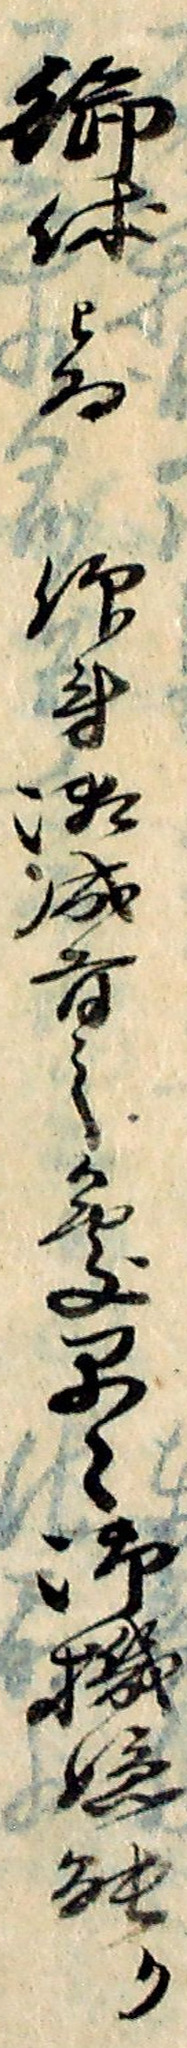御休被為仰付御成有之候処早々御機嫌能く
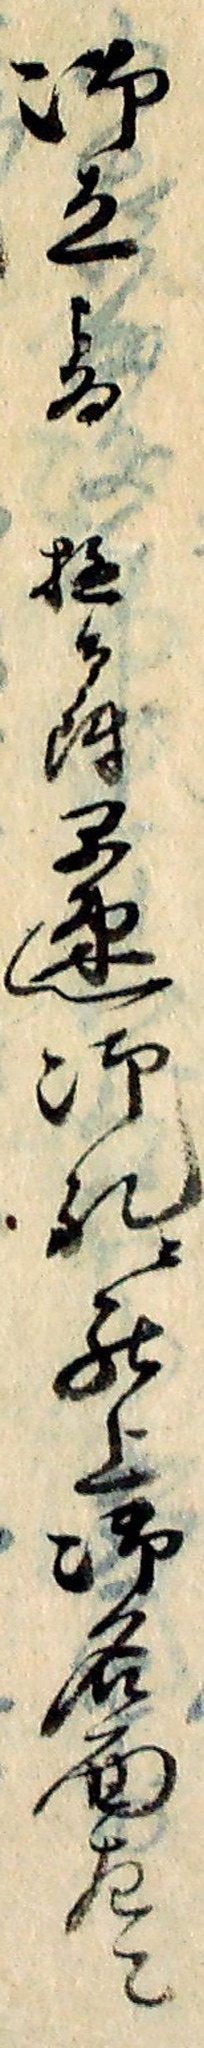御立被為遊候に附早速御礼に罷上御名面左に
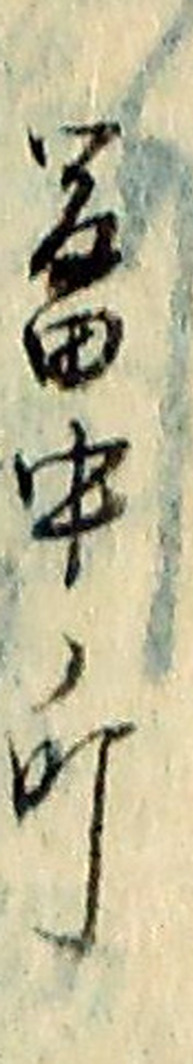富田中ノ町
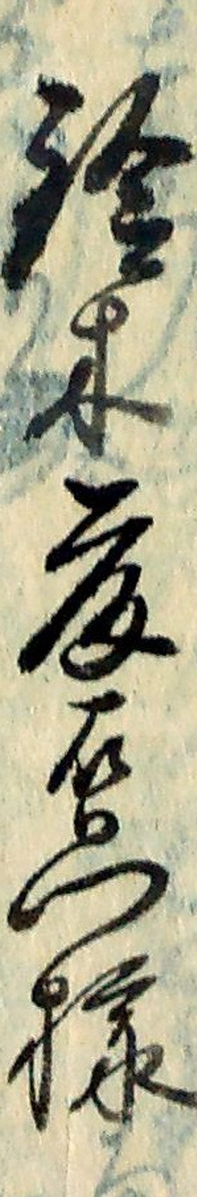鈴木藤右衛門様
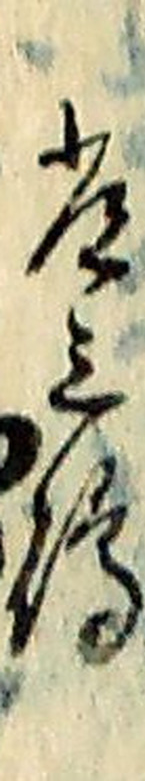常三島
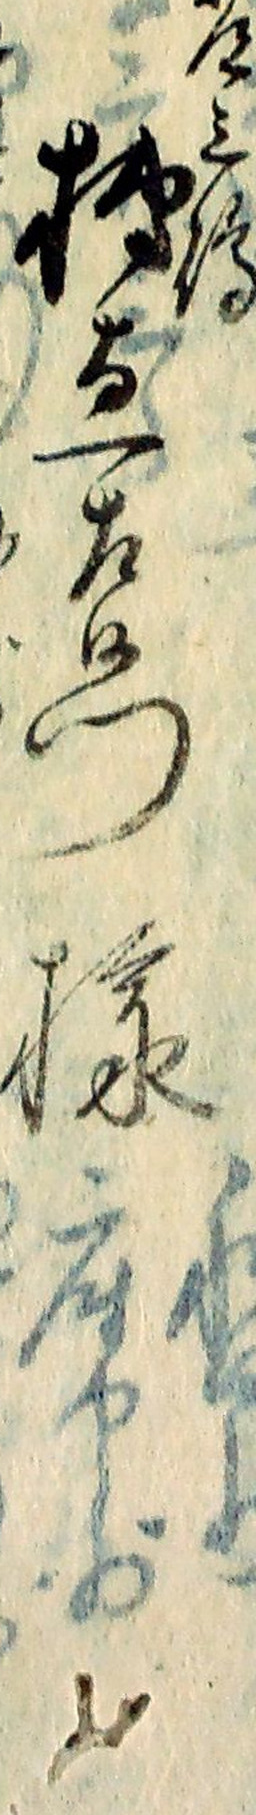柿与一左衛門様
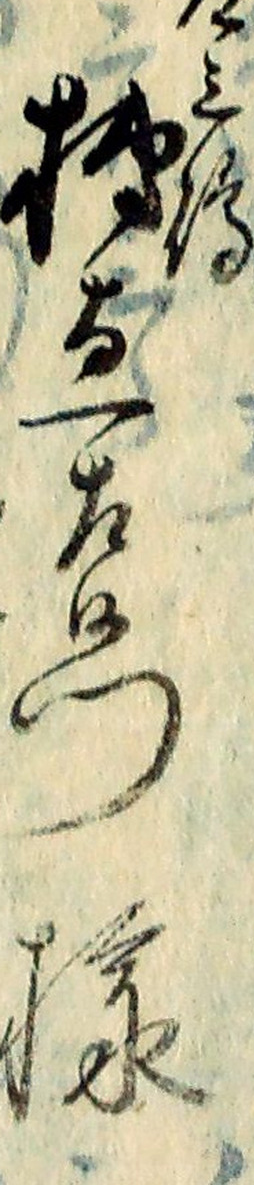柿与一左衛門様
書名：諸御願書控(後藤氏壱番）
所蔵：鳴門教育大学 Naruto University of Education
